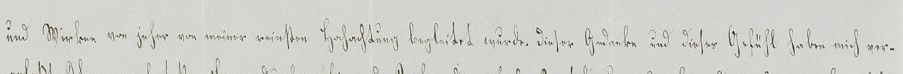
und Wirken von jeher von meiner reinsten Hochachtung begleitet wurde, dieser Gedanke und dieses Gefühl haben mich ver-
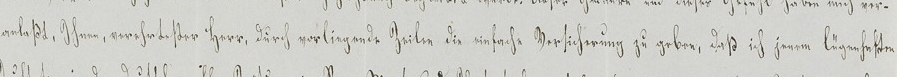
anlaßt, Ihnen, verehrtester Herr, durch vorliegende Zeilen die einfache Versicherung zu geben, daß ich jenem lügenhaften
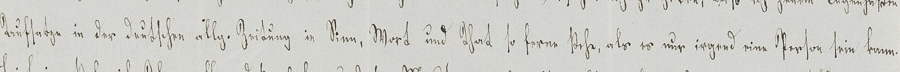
Aufsatze in der Deutschen allg. Zeitung in Sinn, Wort und That so ferne stehe, als es nur irgend eine Person sein kann.
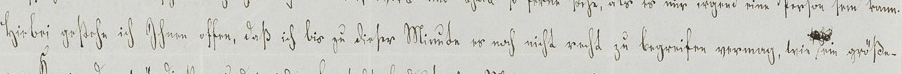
Hiebei gestehe ich Ihnen offen, daß ich bis zu dieser Minute es noch nicht recht zu begreifen vermag, wie ... ein größe-
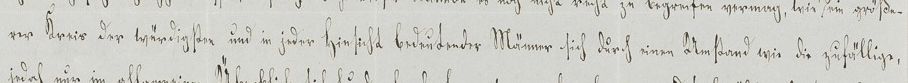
rer Kreis der würdigsten und in jeder Hinsicht bedeutender Männer sich durch einen Umstand wie die zufällige,
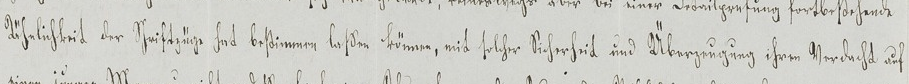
Ähnlichkeit der Schriftzüge hat bestimmen lassen können, mit solcher Sicherheit und Überzeugung ihren Verdacht auf
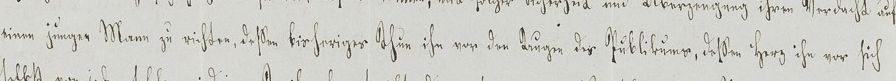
einen jungen Mann zu richten, dessen bisheriges Thun ihn vor den Augen des Publikums, dessen Herz ihn vor sich
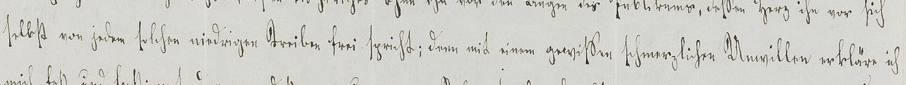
selbst von jedem solchen niedrigen Treiben frei spricht; denn mit einem gewissen schmerzlichen Unwillen erkläre ich
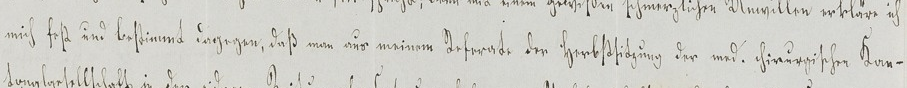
mich fest und bestimmt dagegen, daß man aus meinem Referate der Herbstsitzung der med. chirurgischen Kan-
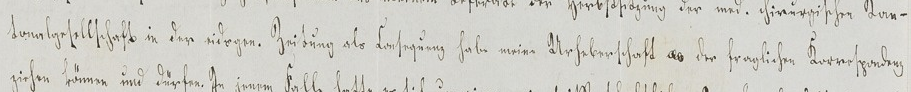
tonalgesellschaft in der eidgen. Zeitung als Consequenz habe meine Urheberschaft ... der fraglichen Korrespondenz
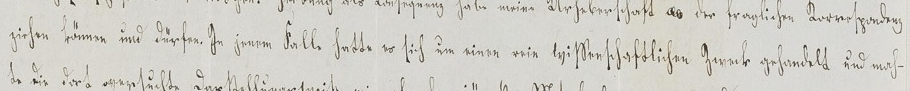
ziehen können und dürfen. In jenem Falle hatte es sich um einen rein wissenschaftlichen Zweck gehandelt und moch-
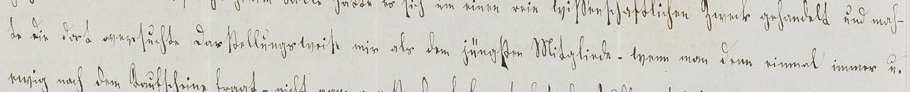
te die dort versuchte Darstellungsweise mir als dem jüngsten Mitgliede – wenn man denn einmal immer u.
